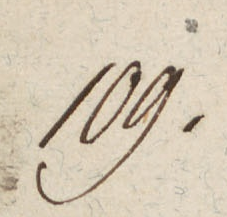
109.
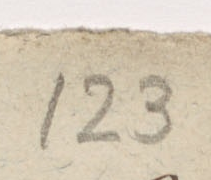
123
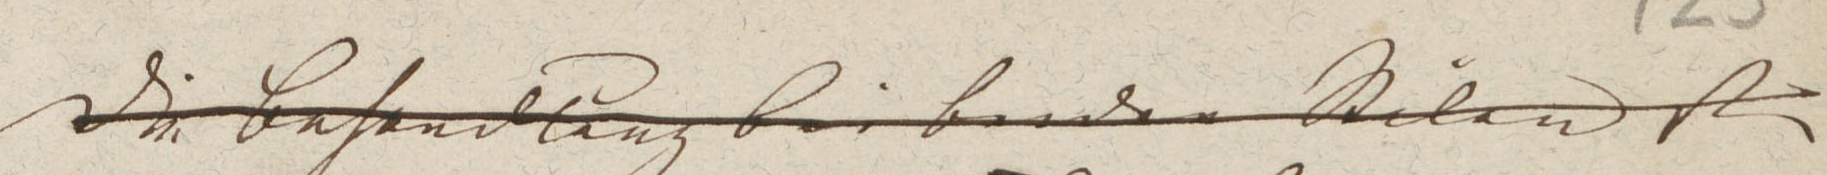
Die Behandlung bei beiden Stilen ist
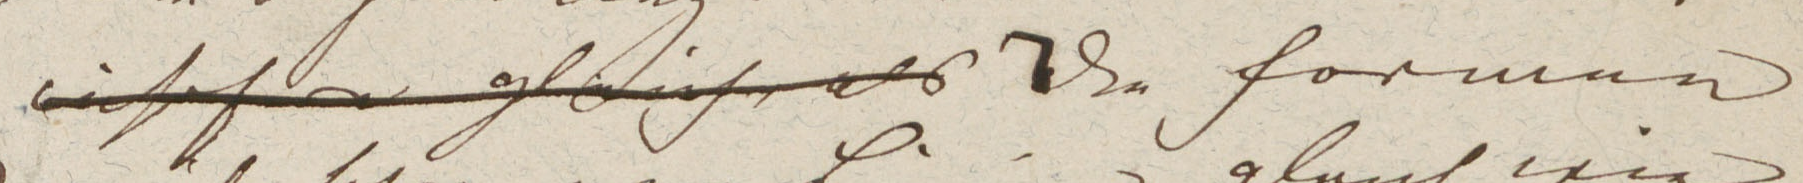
insofern gleich, als dDie Formen
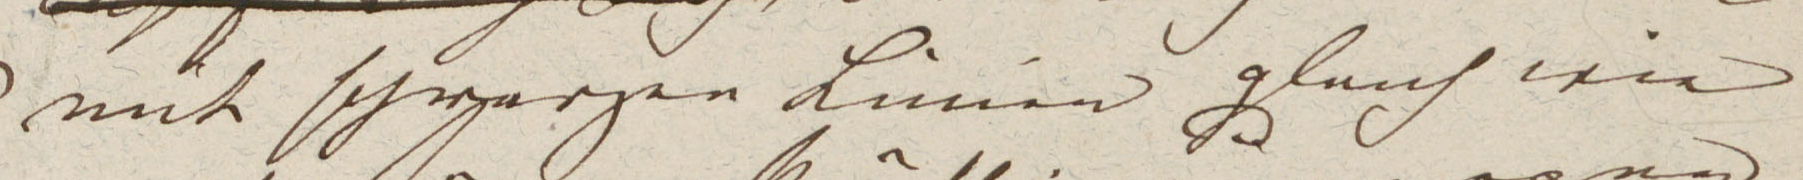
mit schwarzen Linien gleich wie
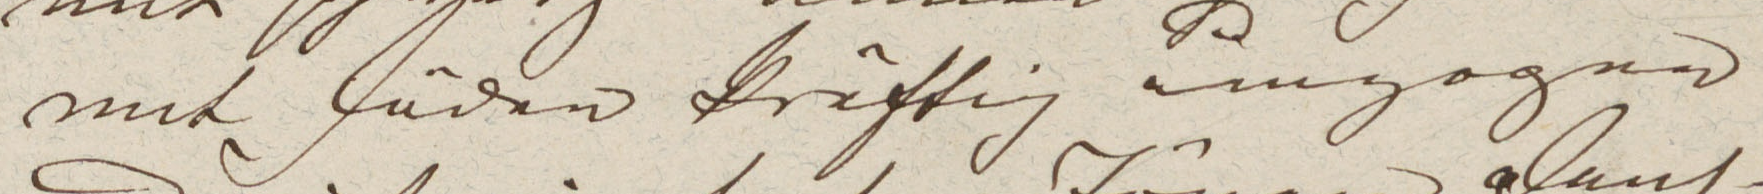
mit Fäden kräftig umzogen
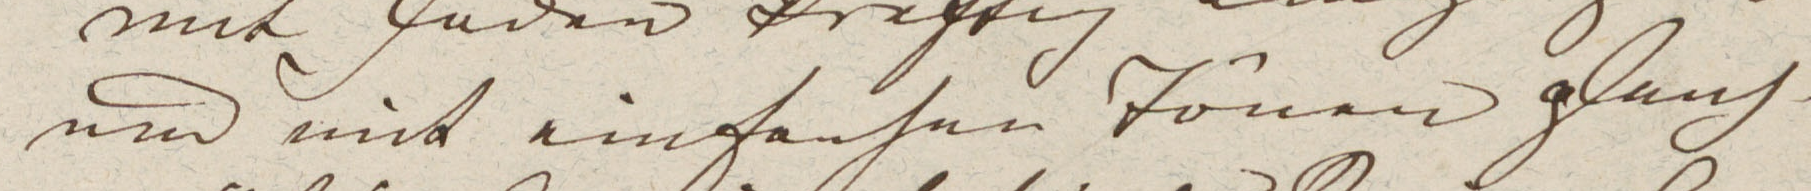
und mit einfachen Tönen gleich-
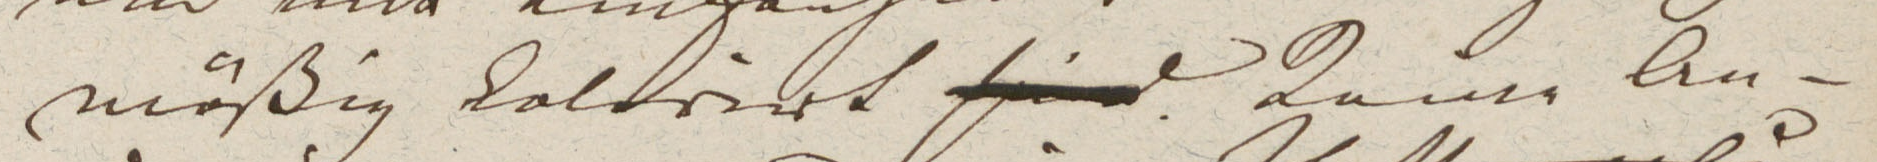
mässig kolorirt sind. Keine An-
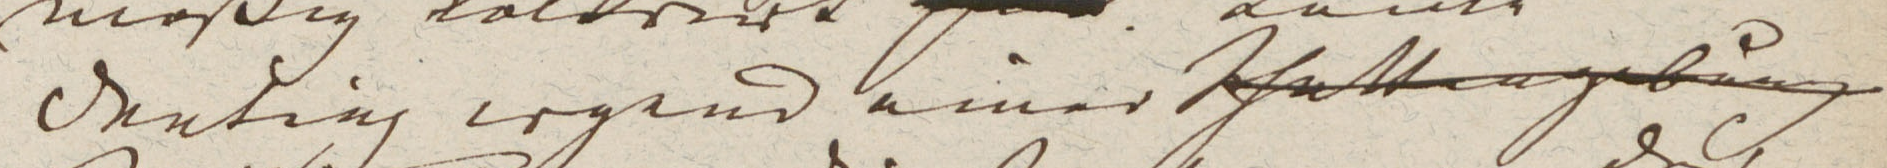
deutung irgend einer Schattengebung
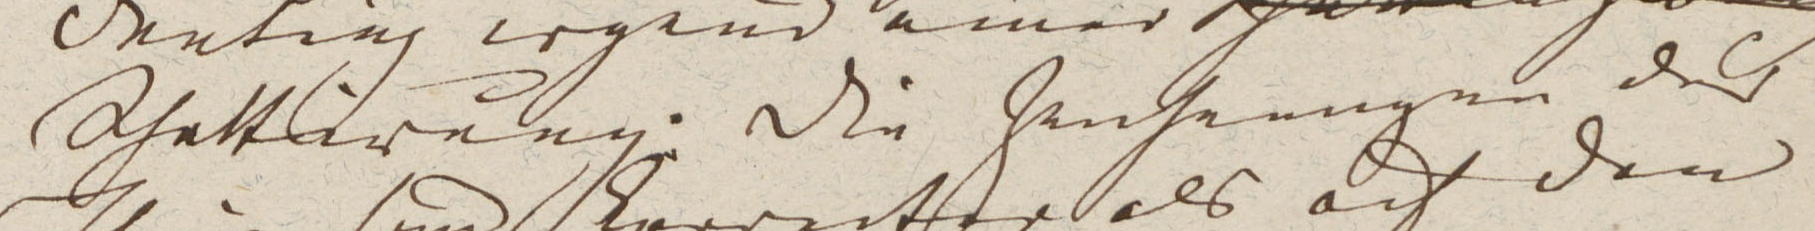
Schattirung: Die Zeichnungen der
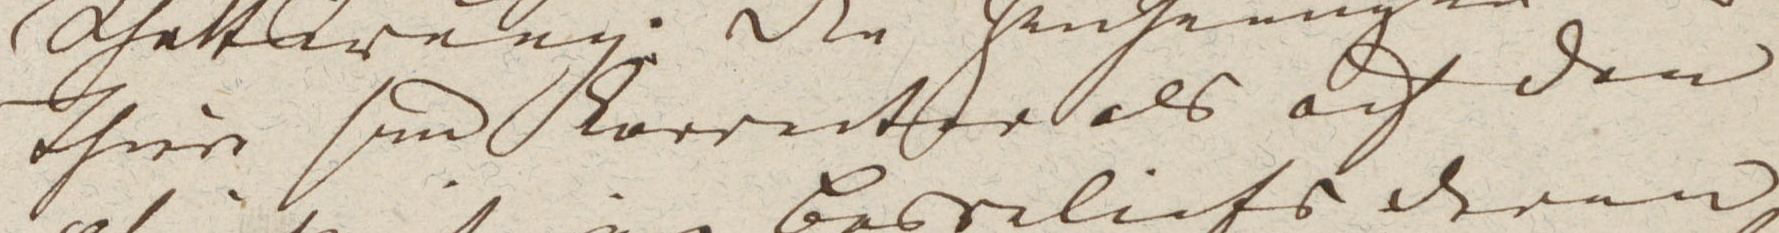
Thiere sind korrecter als auf den
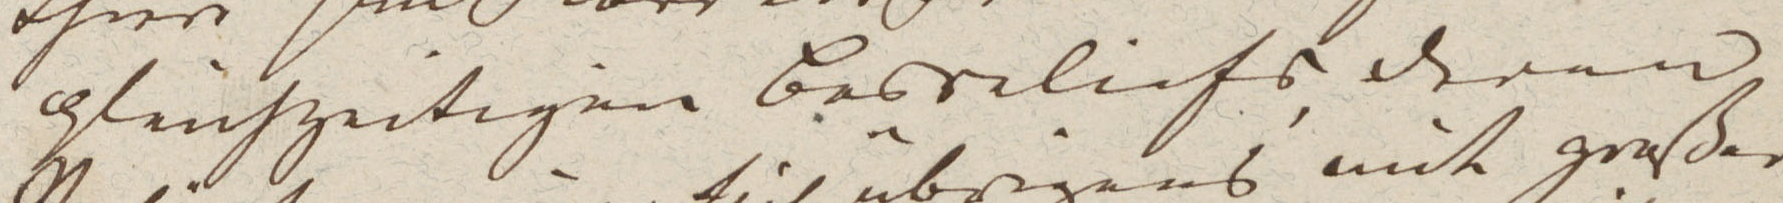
gleichzeitigen Basreliefs deren
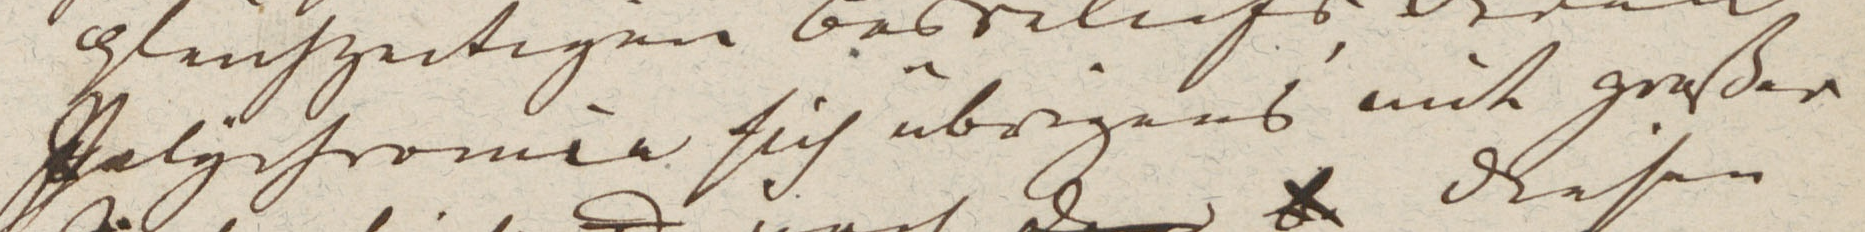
Polychromie sich übrigens mit grosser
